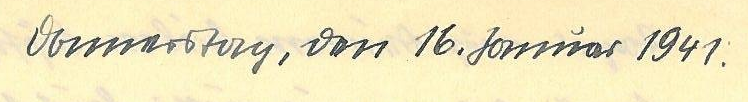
Donnerstag, den 16. Januar 1941.
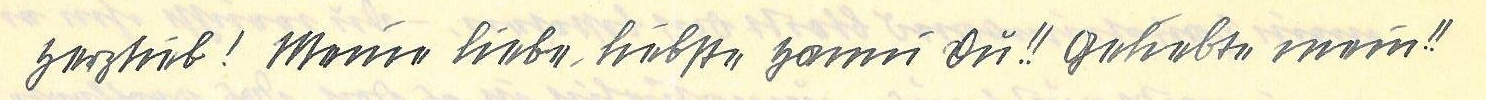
Herzlieb! Meine liebe, liebste Du!! Geliebte mein!!
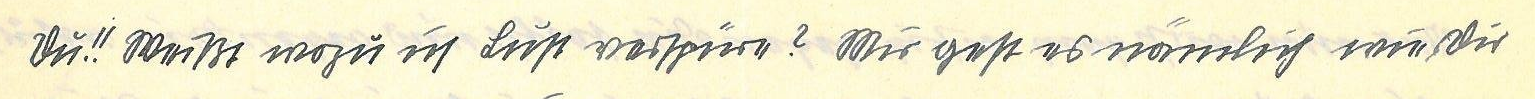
Du!! Weißt wozu ich Lust verspüre? Mir geht es nämlich wie Dir
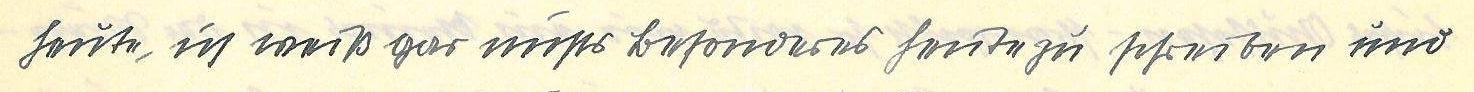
heute, ich weiß gar nichts Besonderes heute zu schreiben und
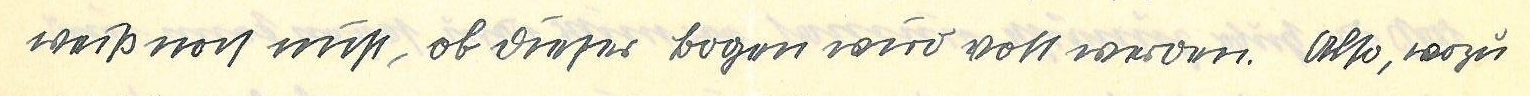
weiß noch nicht, ob dieser Bogen wird voll werden. Also, wozu
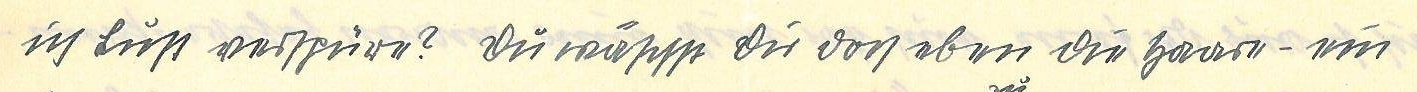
ich Lust verspüre? Du wäschst Dir doch eben die Haare – ein
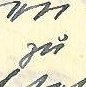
zu
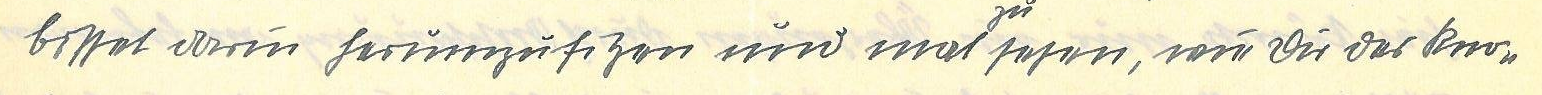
bissel darin herumzufitzen und mal sehen, wie Dir der Kno¬
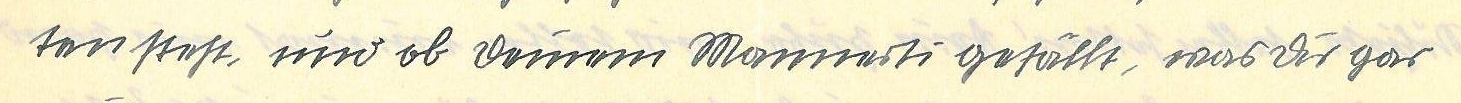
ten steht, und ob Deinem Mannerli gefällt, was Dir gar
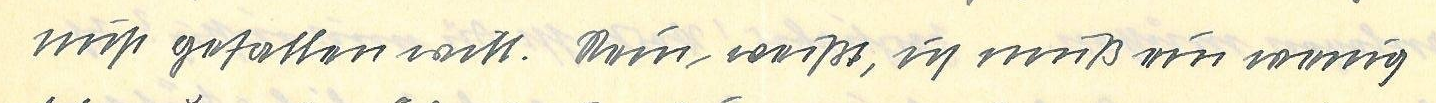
nicht gefallen will. Nein, weißt, ich muß ein wenig
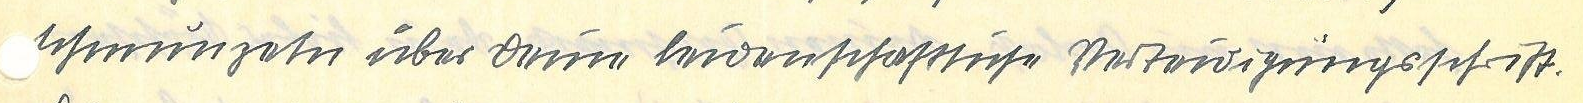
Schmunzeln über Deine leidenschaftliche Verteidigungsschrift.
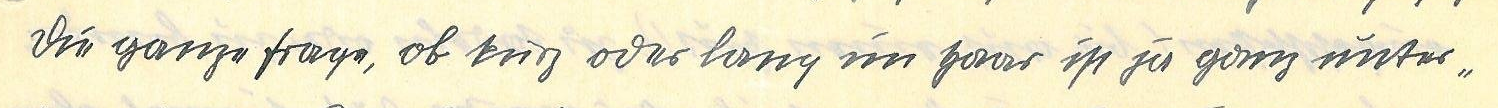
Die ganze Frage, ob kurz oder lang ein Haar ist ja ganz unter¬
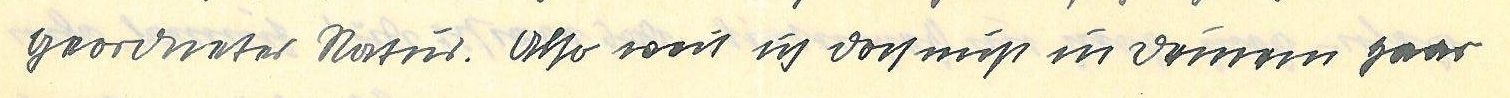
geordneter Natur. Also weil ich doch nicht in Deinem Haar
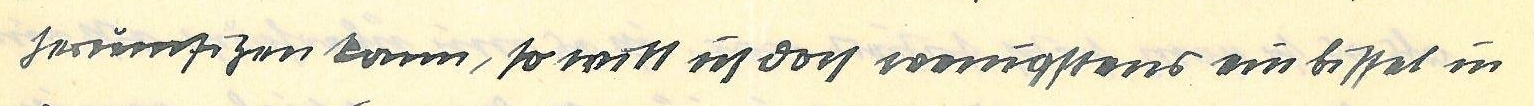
herumfitzen kann, so will ich doch wenigstens ein bissel in
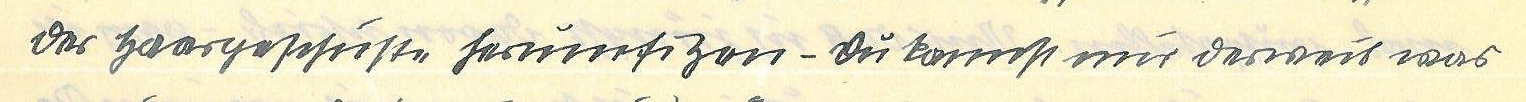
der Haargeschichte herumfitzen – Du kannst mir derweil was
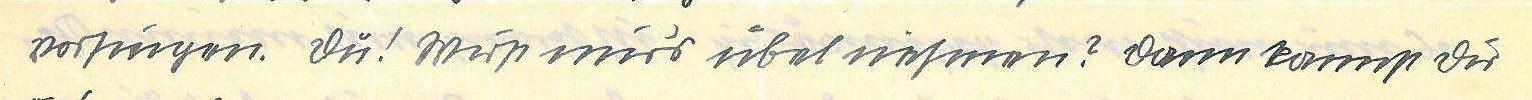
vorsingen. Du! Wirst mir’s übel nehmen? Dann kannst Dir
